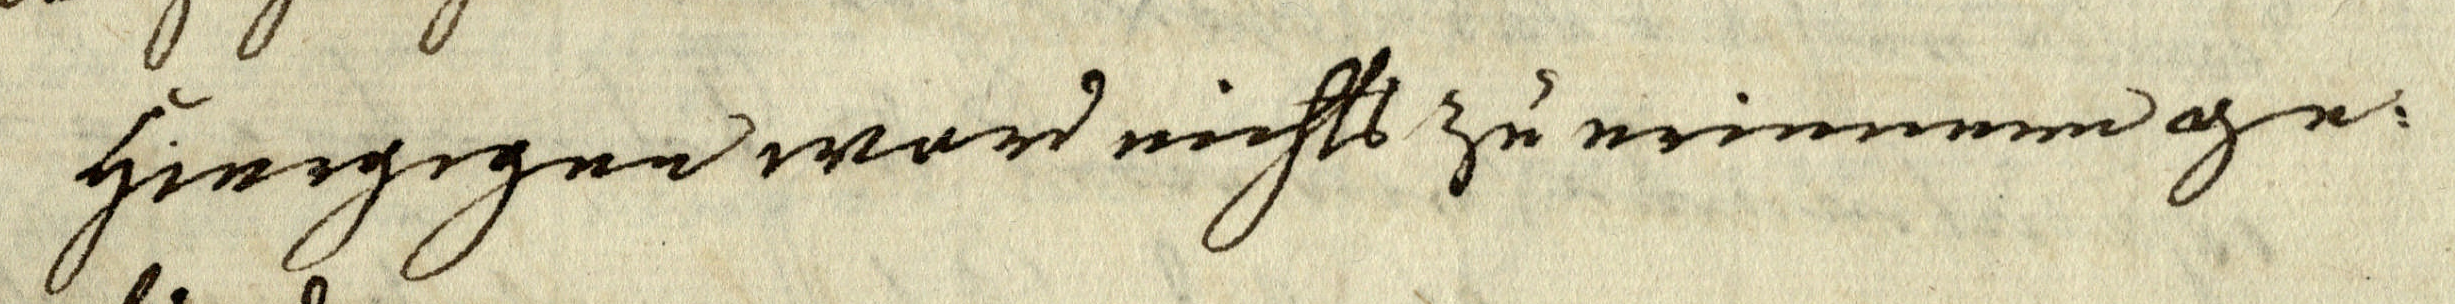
Hiergegen ward nichts zu erinnern ge¬
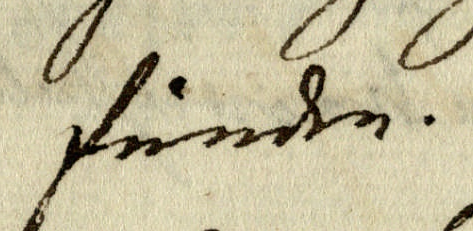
funden.
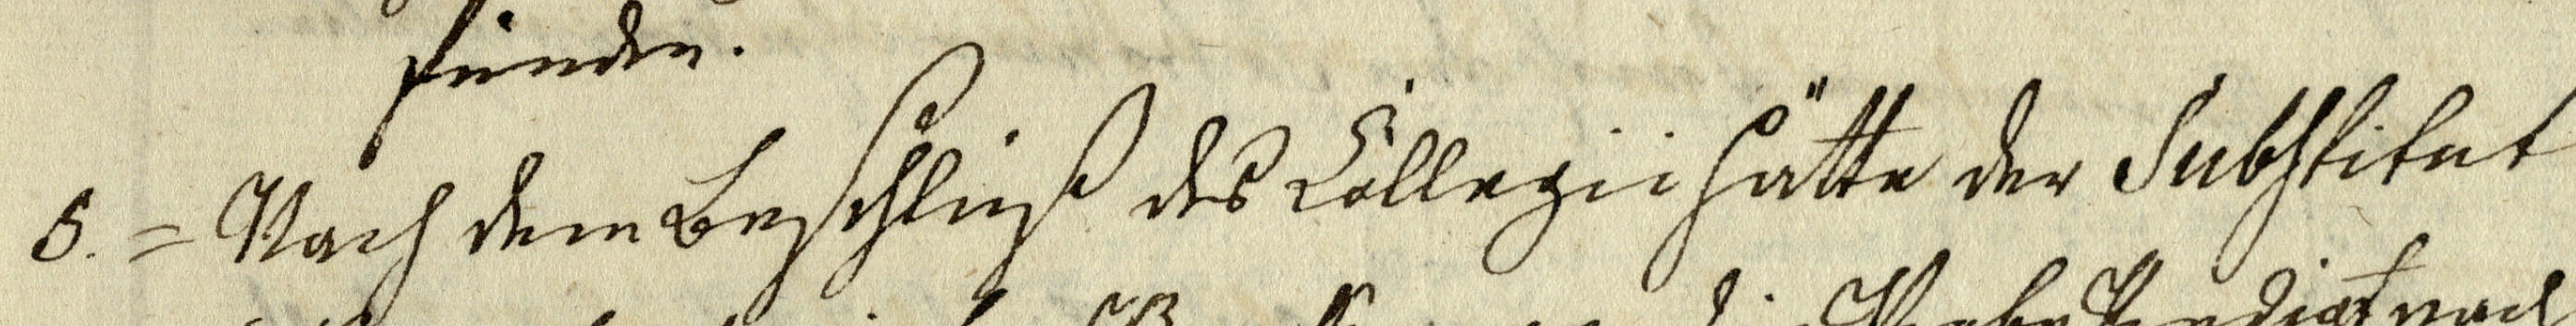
5. = Nach dem Beschluß des collegii hätte der Substitut
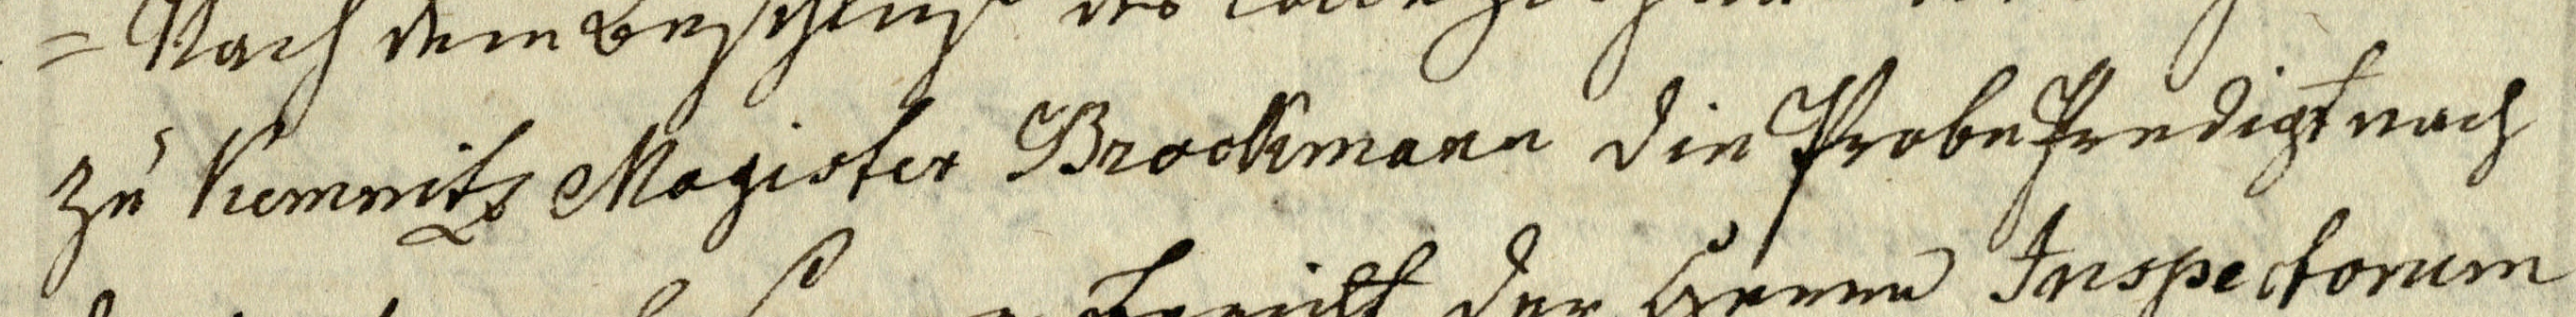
zu Kemnitz Magister Brockmann die Probe Predigt nach
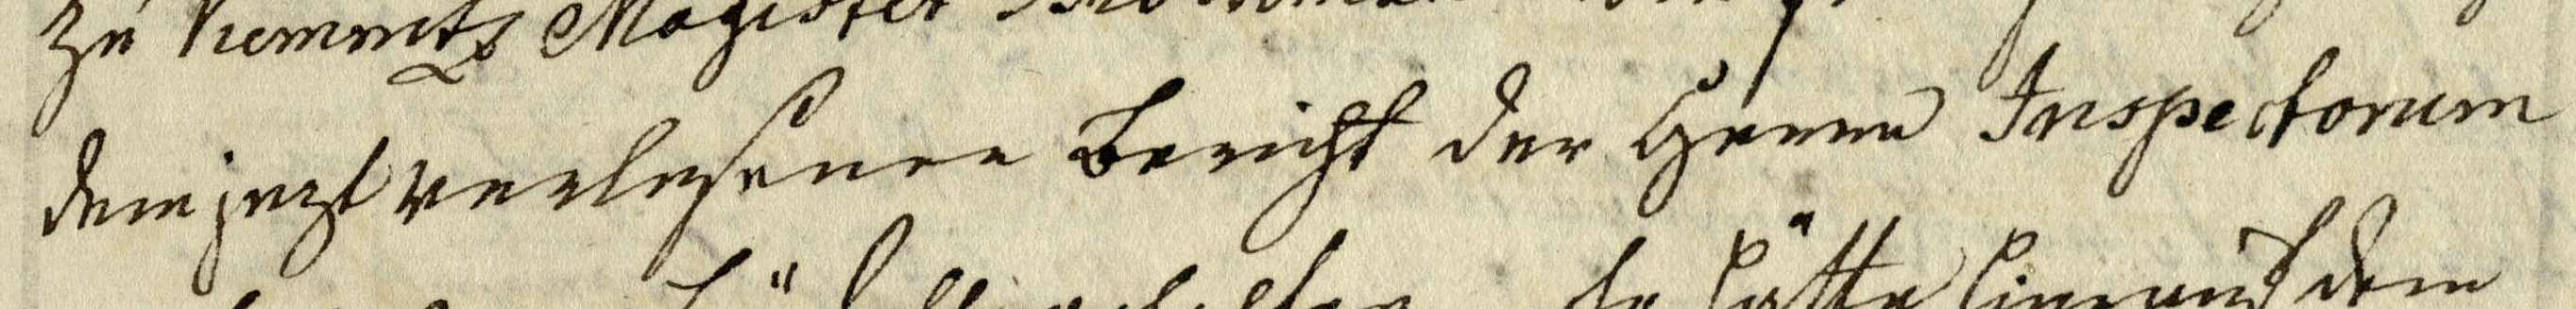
dem jezt verlesenen Bericht der Herrn Inspectorum
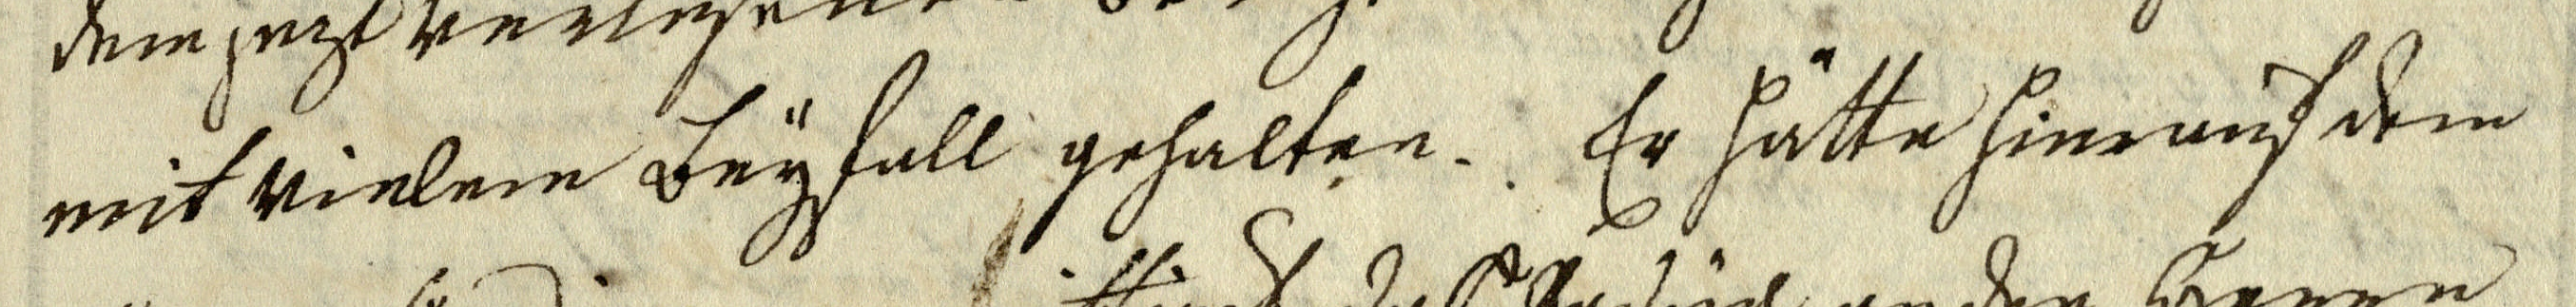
mit vielem Beÿfall gehalten. Er hätte hierauf dem
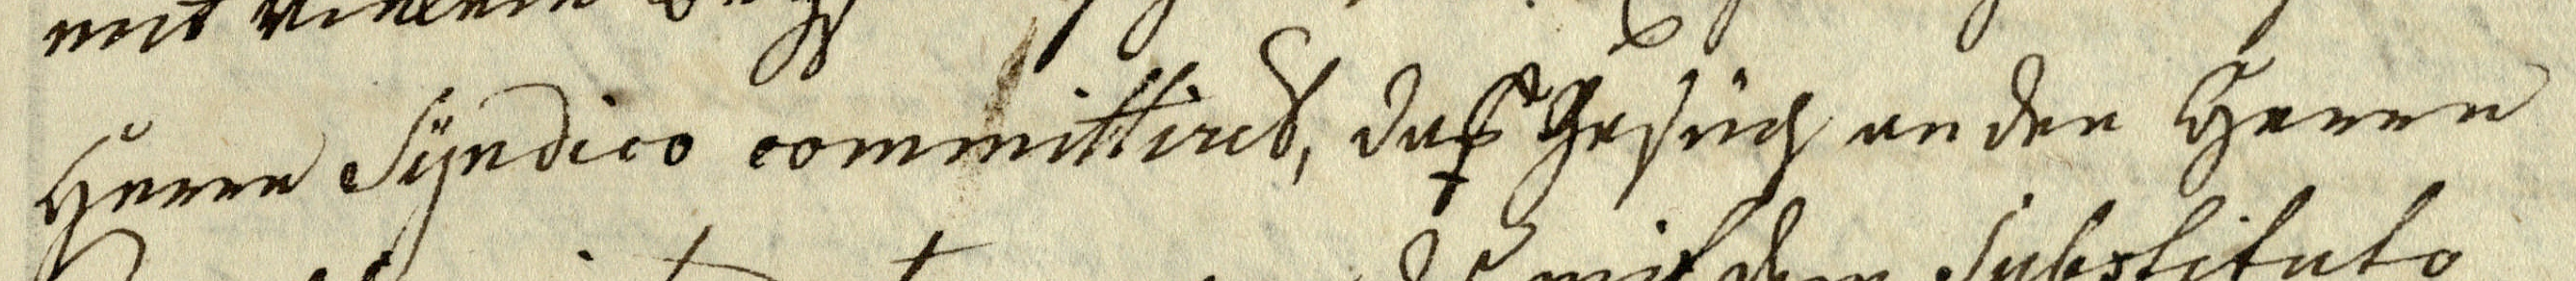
Herrn Sÿndico committiret, daß Gesuch an den Herrn
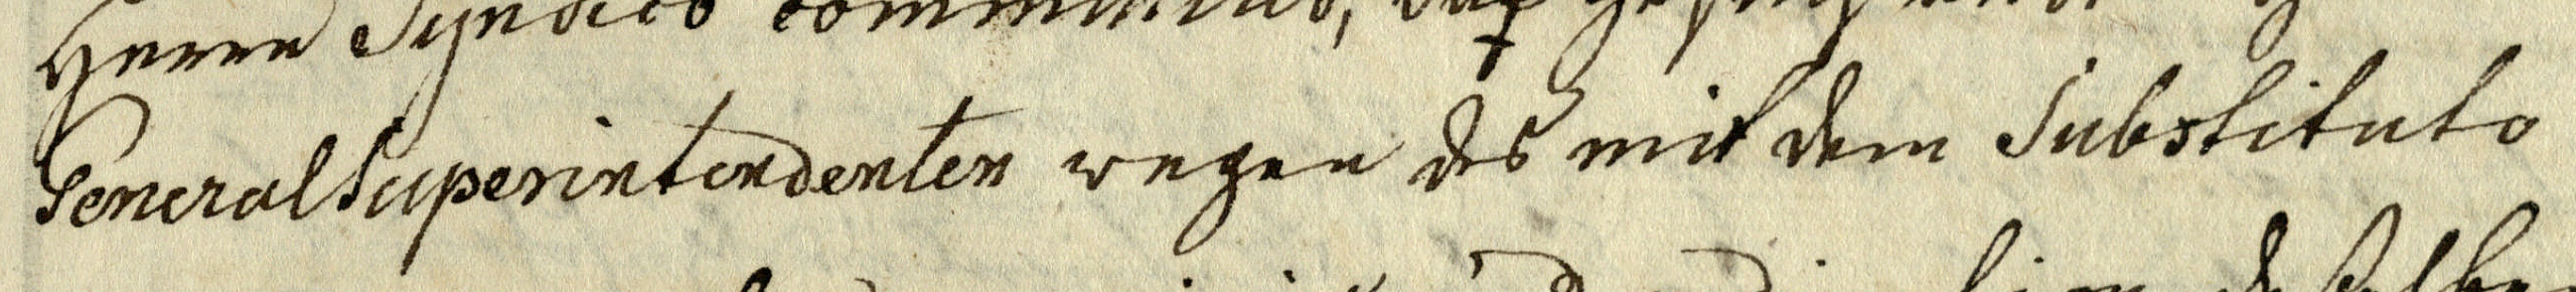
General Superintendenten wegen des mit dem Substituto
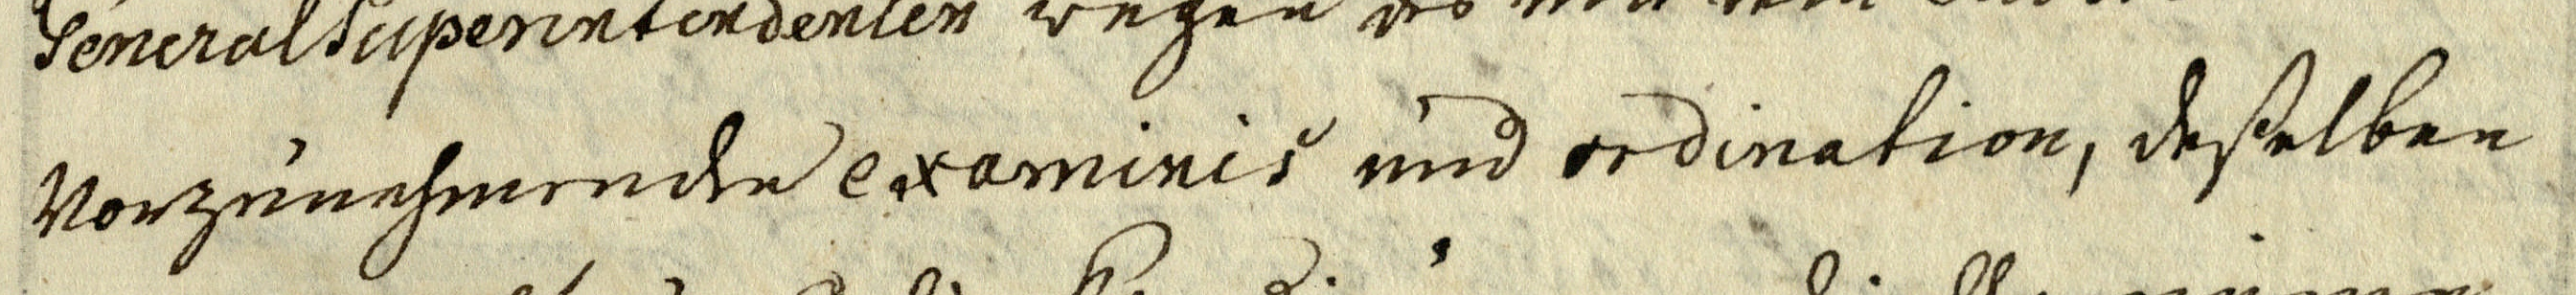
vorzunehmende examinis und ordination, deßelben
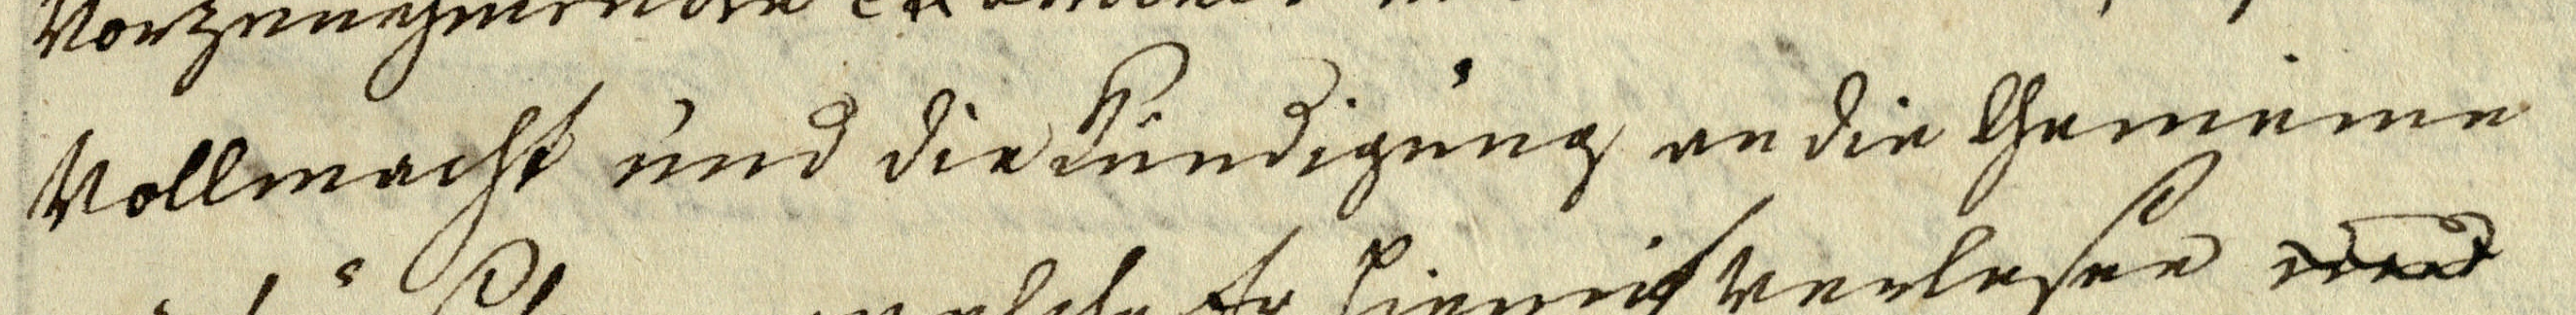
Vollmacht und die Kündigung an die Gemeine
